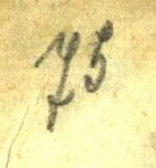75
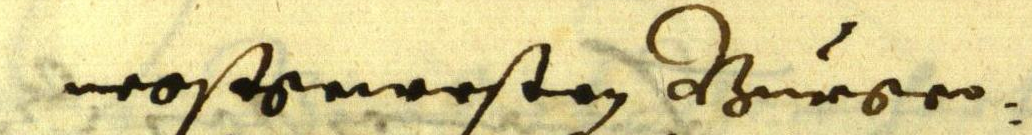negstgewesten Būrger¬
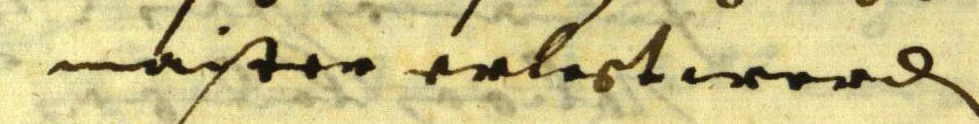maister erlegt werd.
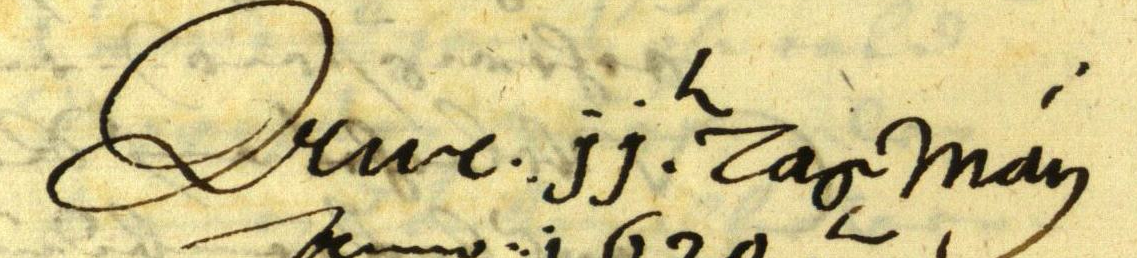Am: 11.t Tag Maȳ
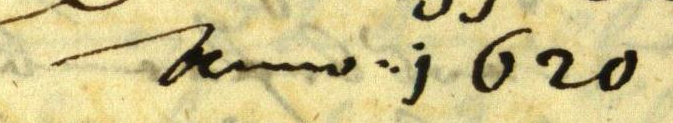Anno: 1620.t
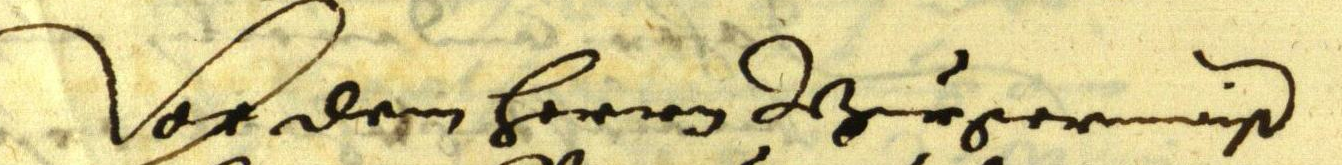Vor dem herrn Būrgermaist
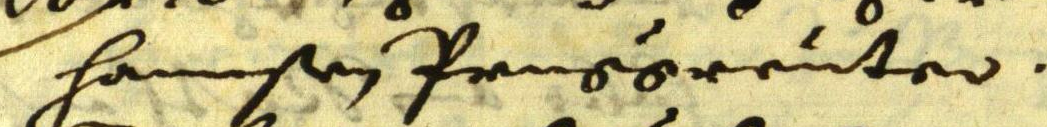hannsen Prūggreūter.
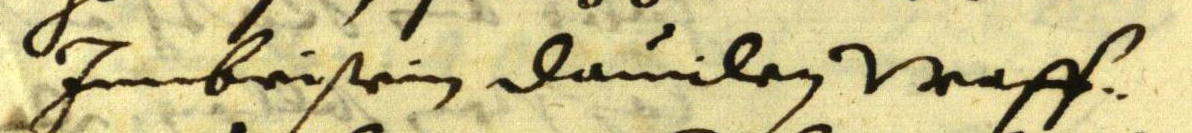Innbeisein Daūiden Waff¬
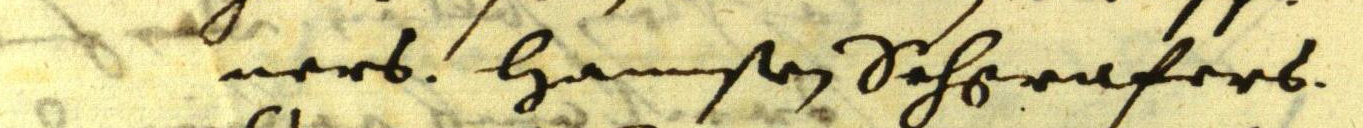ners. Hannsen Schgrafers.
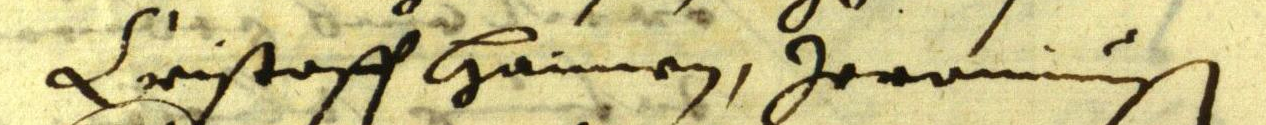Cristoff Haimen, Jeronimūs
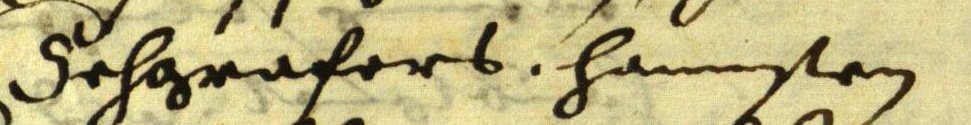Schgrafers. hannsen
